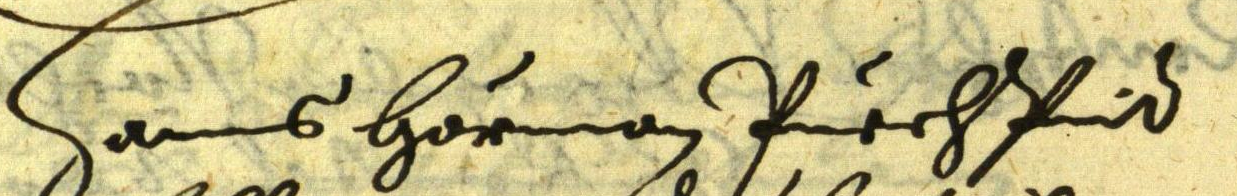Hanns Hōrman PūechPint
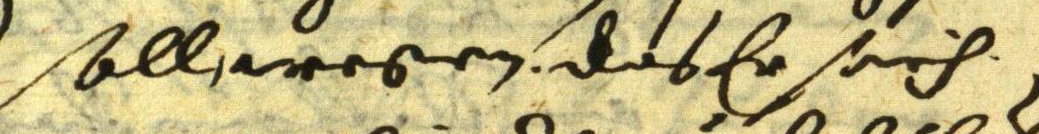soll wegen. das Er sich.
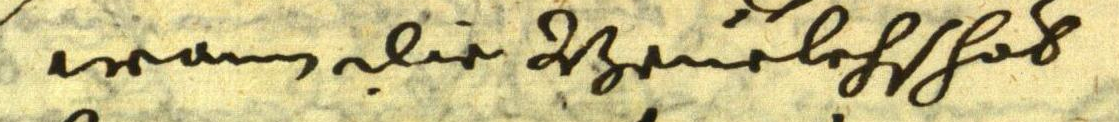wann die Beūelchshab
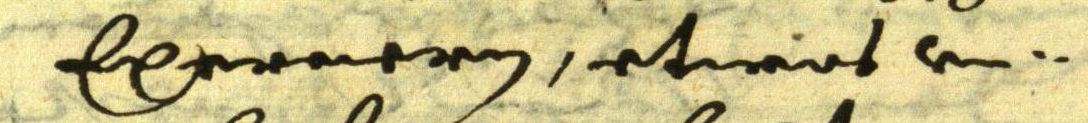Exerciern, etwas vn¬
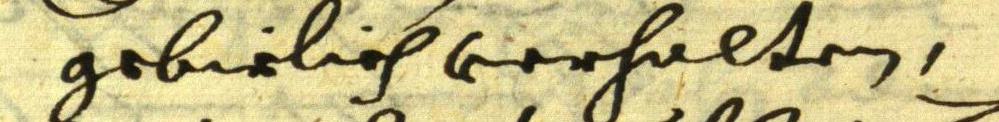gebirlich verhalten,
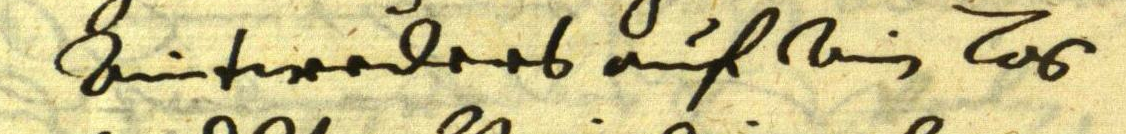Aintweders aūf Ain Tag
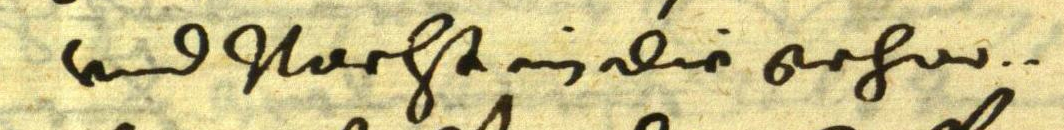vnd Nacht in die gehor¬
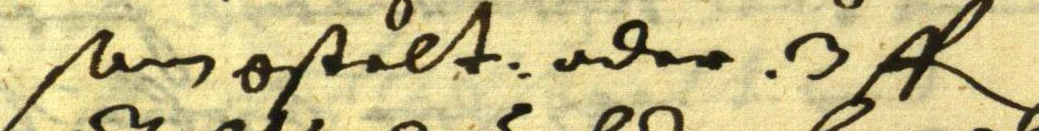sam gstelt: oder .3 fl
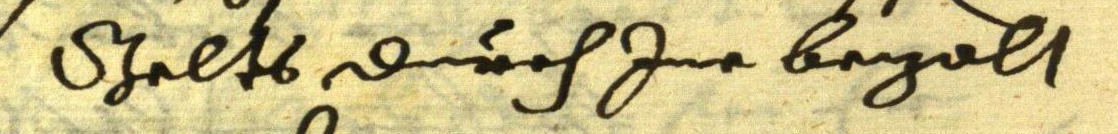Gelts dūrch Ine bezalt
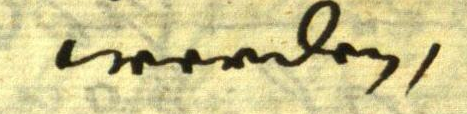werden,
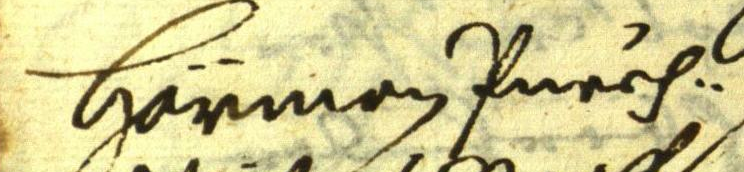Hörman Pūch¬
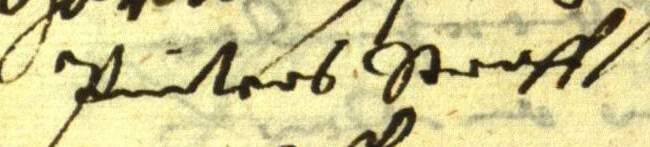Pinters Straff
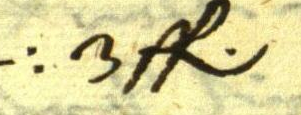—: 3 fl.
